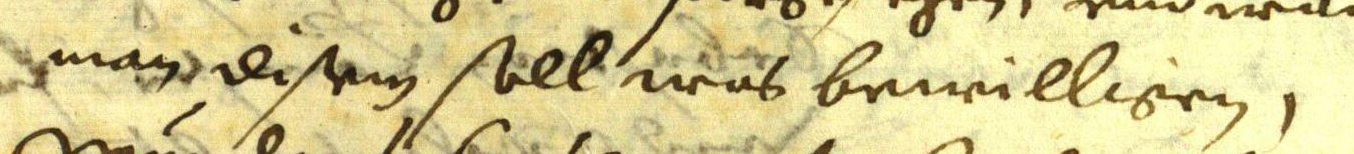man disem soll was bewilligen,
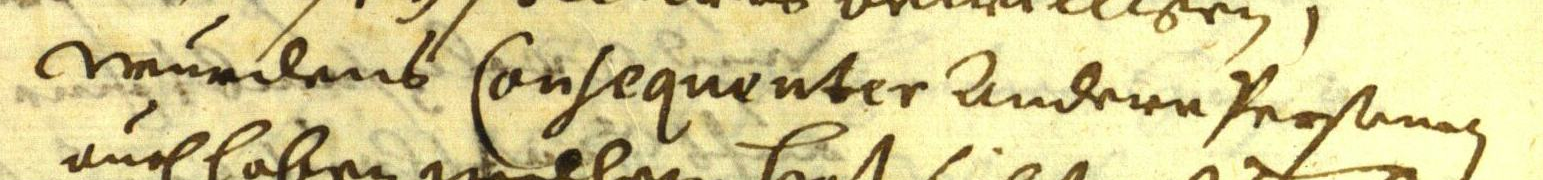wūrdens Consequenter Andern Personen
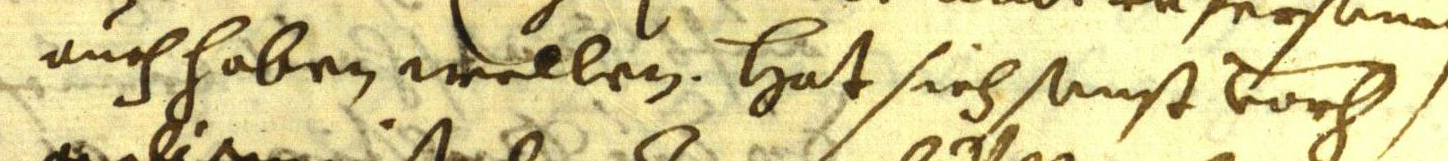aūch haben wellen. Hat sich sonst Vorh
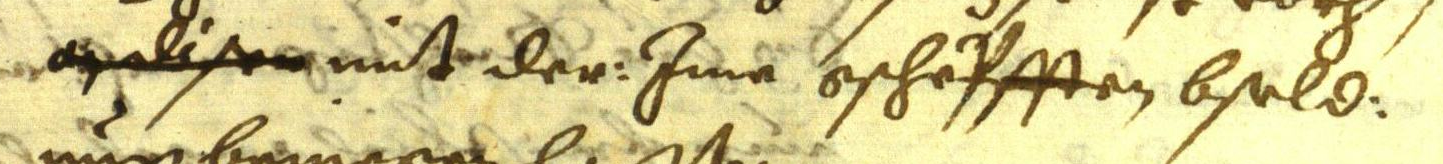malisen mit der. Ime gschePfften besold¬
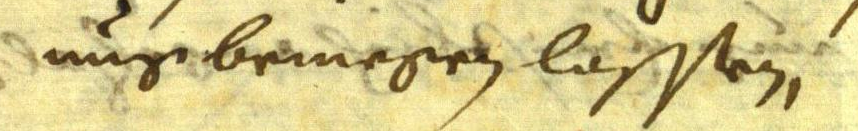ūng beniegen lassen,
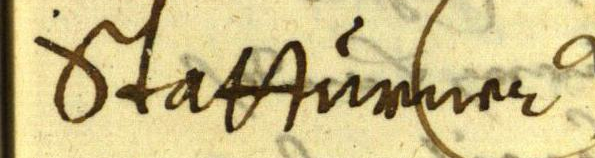Stattūrner
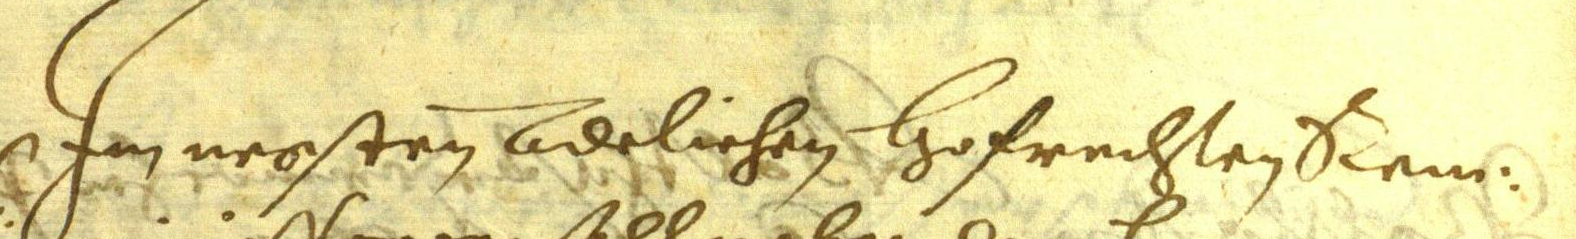Im negsten Adelichen Hofrechten Rem¬
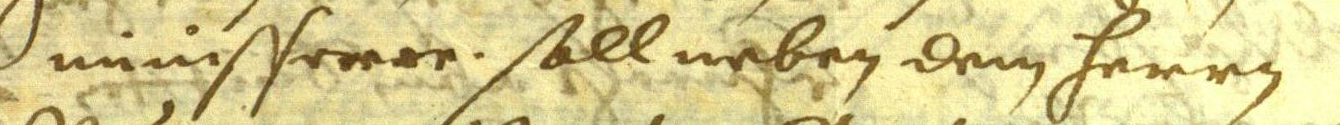minisserer. soll neben dem herrn
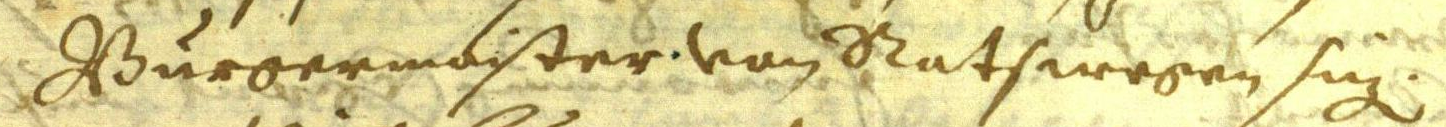Būrgermaister. von Rats wegen siz
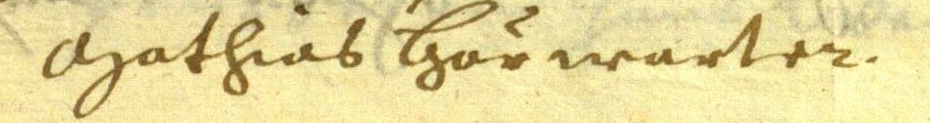Mathias Hōrwarter.
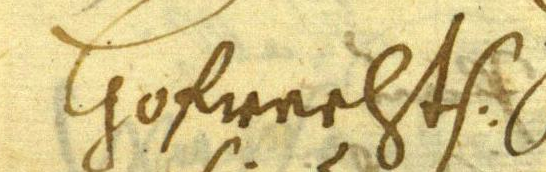Hofrechts¬
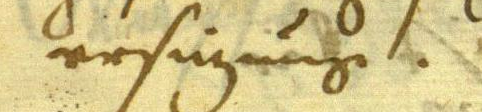ersizūng.
